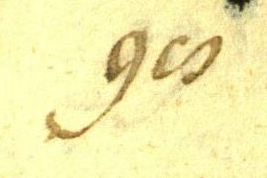98
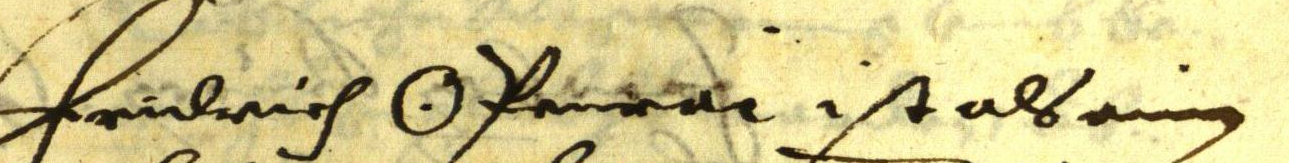Fridrich Openrai ist als aim
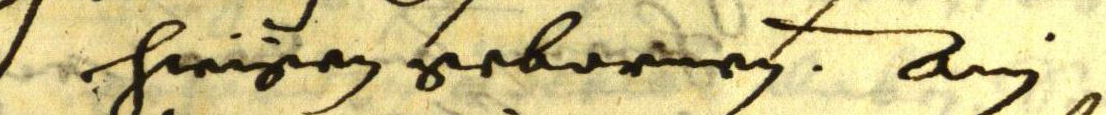hieigen gebornen. Ain
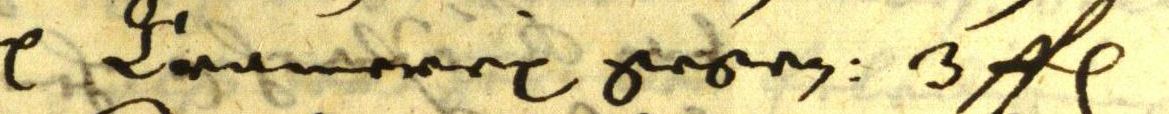Cramerej gegen: 3 fl
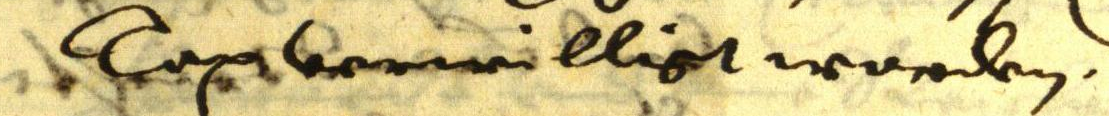Tax verwilligt worden.
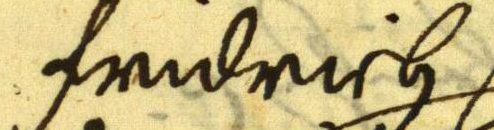Fridrich
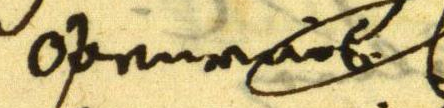Openrais.
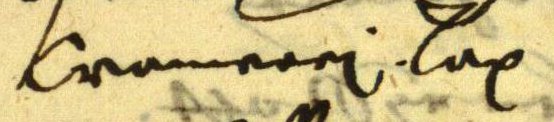Cramerej. Tax
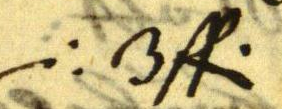—: 3 fl.
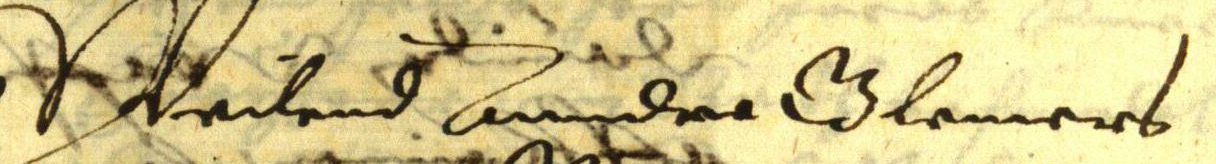Weilend Anndre Glemers
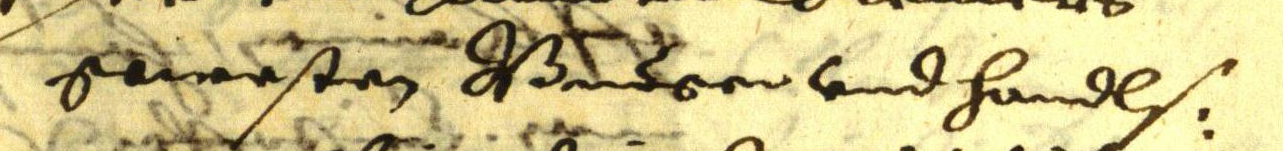gewesten Būrger vnd handls¬
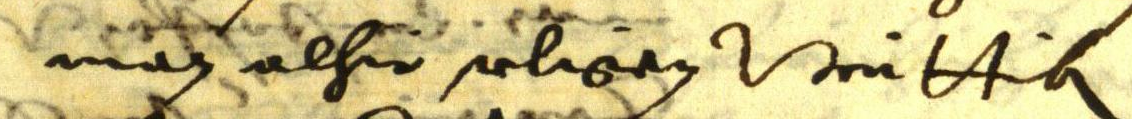man alhie seligen Wittib
